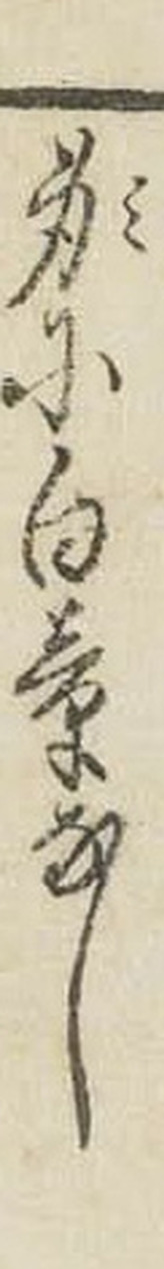身に白章なし

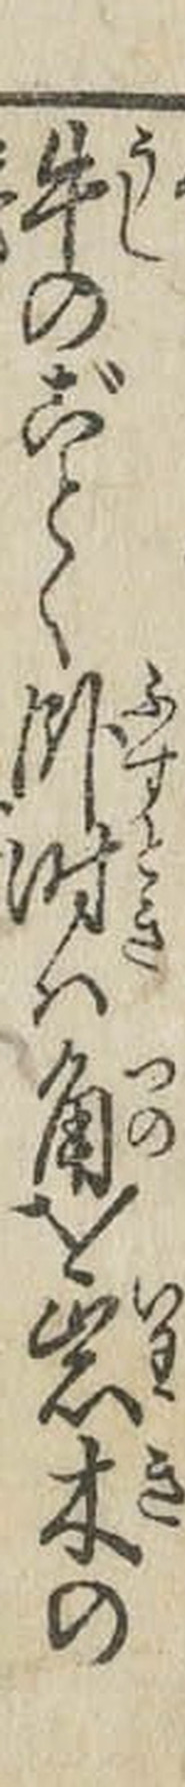牛のごとく臥時は角を岩木の
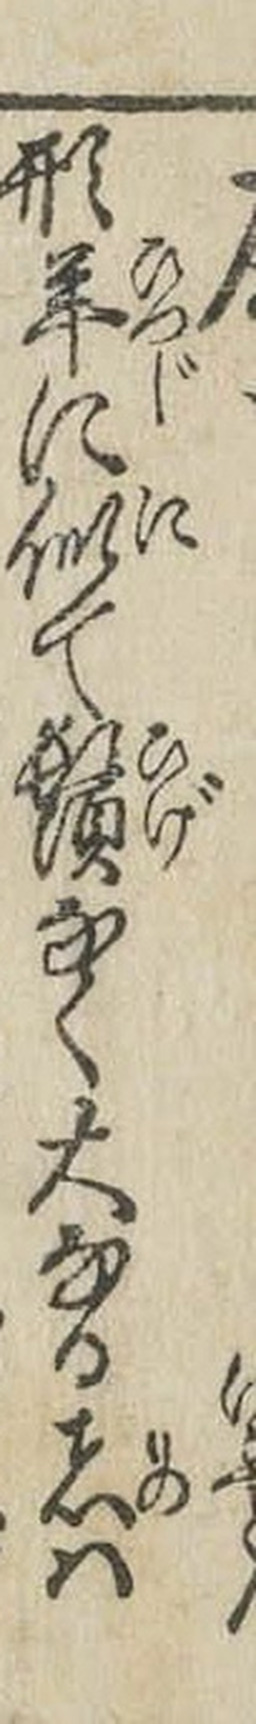形羊に似て鬚なく大なる者は
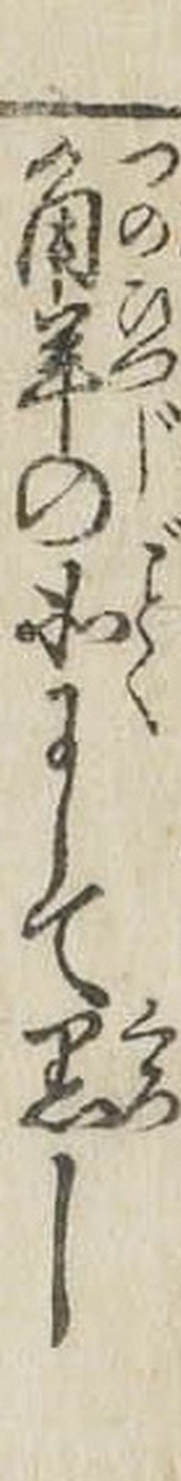角羊の如にして黒し
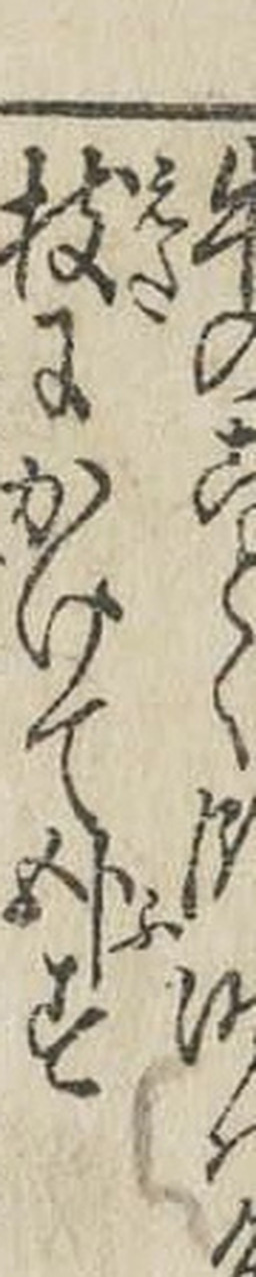枝にかけて臥す
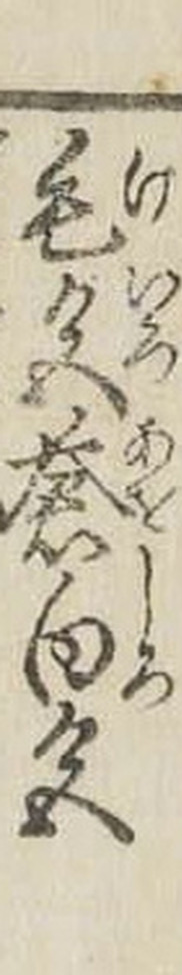毛色蒼白色
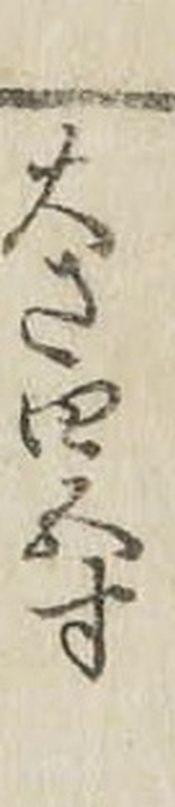大さ四五寸
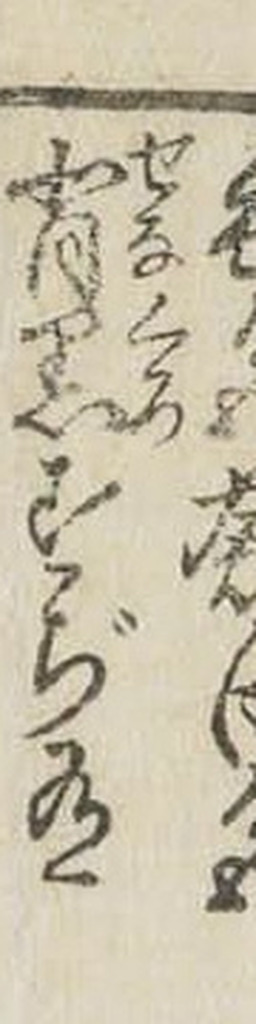背黒すぢ有
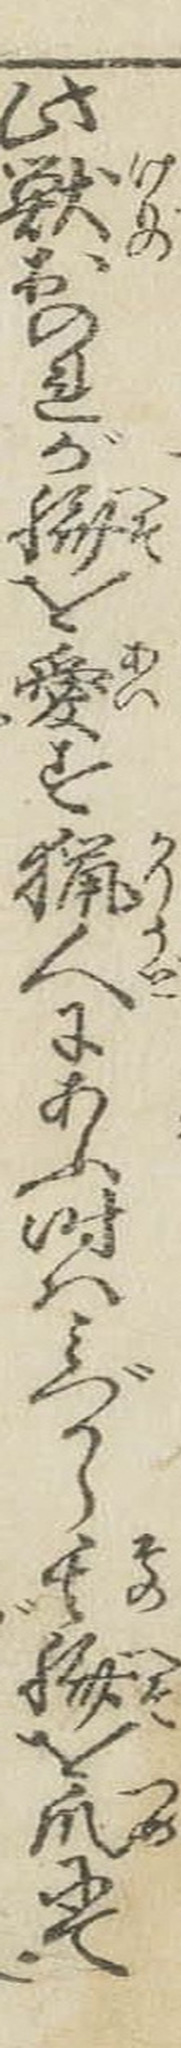此獣おのれが臍を愛す猟人にあふ時はみづから其臍を爪にて
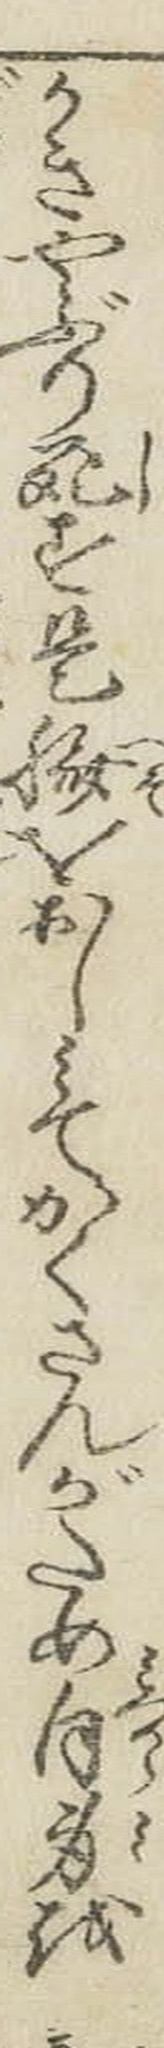かきやぶり死す是臍をおしみてかくさんがため自身を
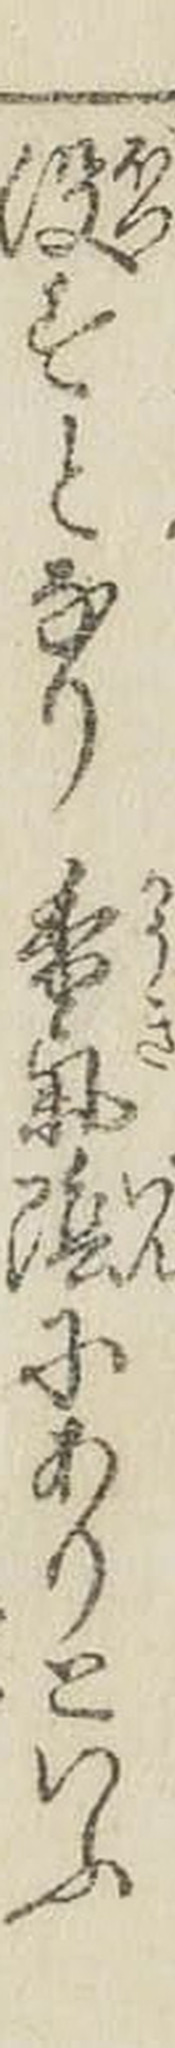没すとなり香気陰にありといふ
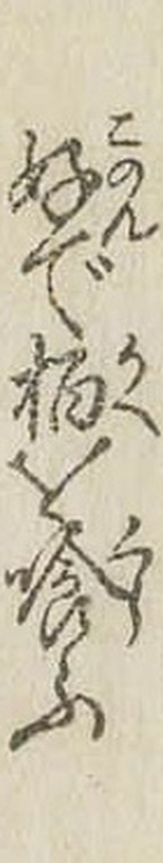好で柏を喰ふ
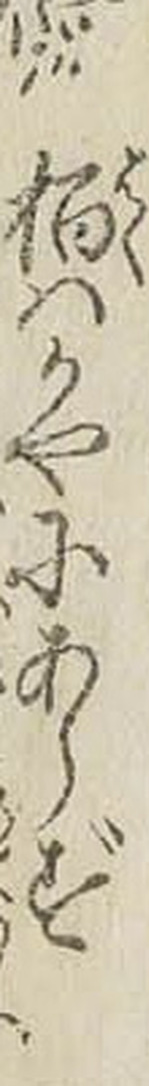柏はかやにあらず
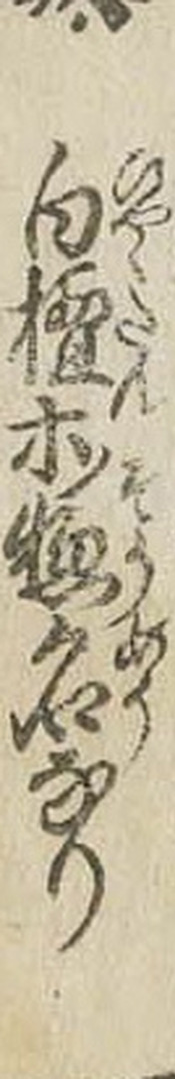白檀等ノ総名なり

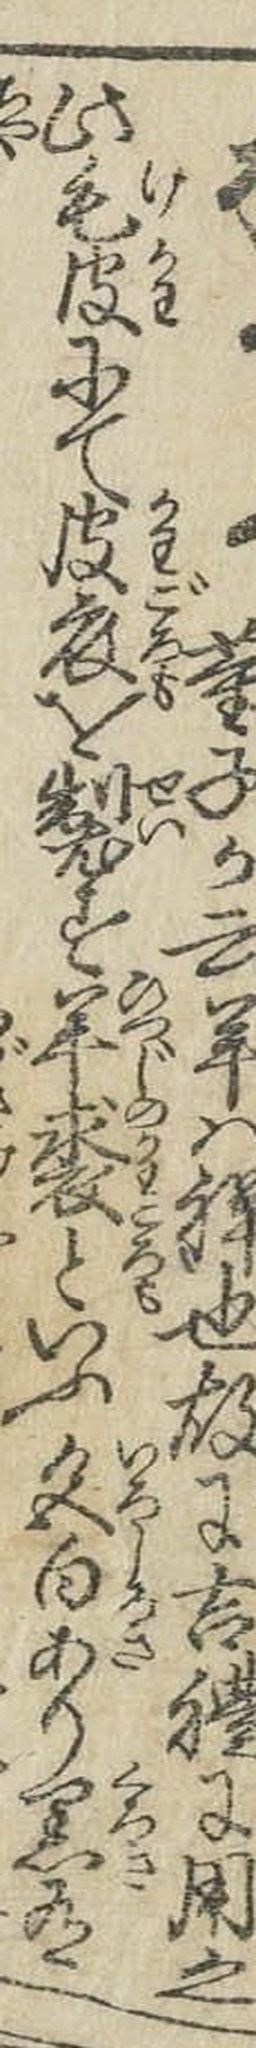此毛皮にて皮衣を製す羊裘といふ色白あり黒有
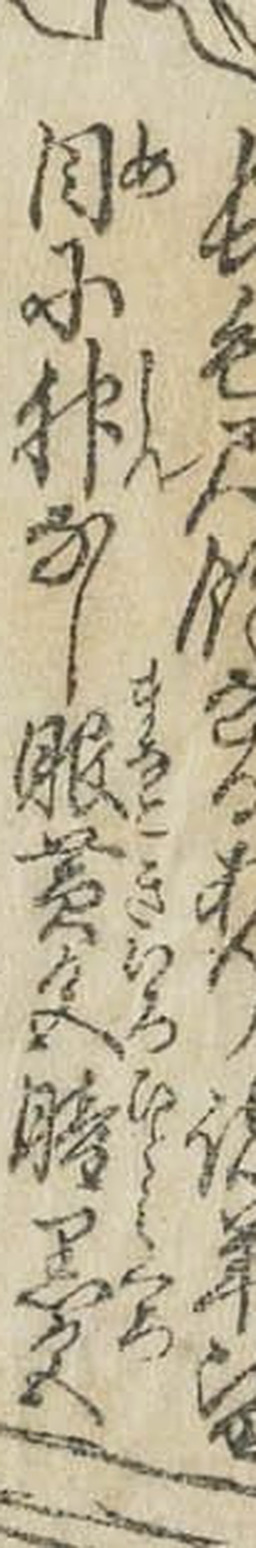目に神なし眼黄色瞳黒色
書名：絵本写宝袋 9巻 9之巻下
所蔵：東京学芸大学教育コンテンツアーカイブ
